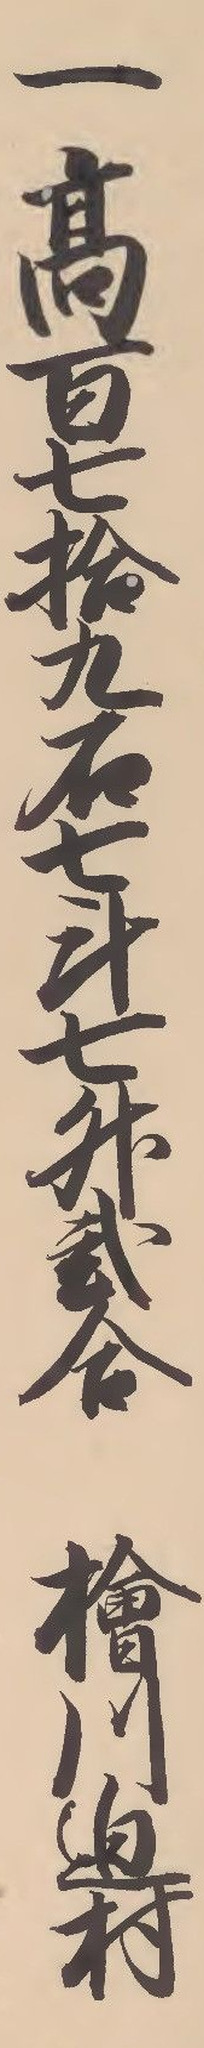一高百七拾九石七斗七升弐合桧川迫村
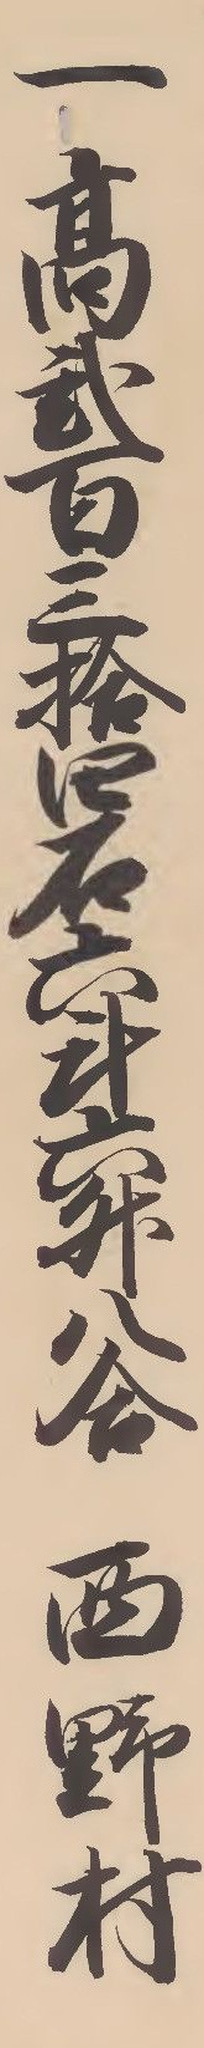一高弐百三拾四石六斗六升八合西野村
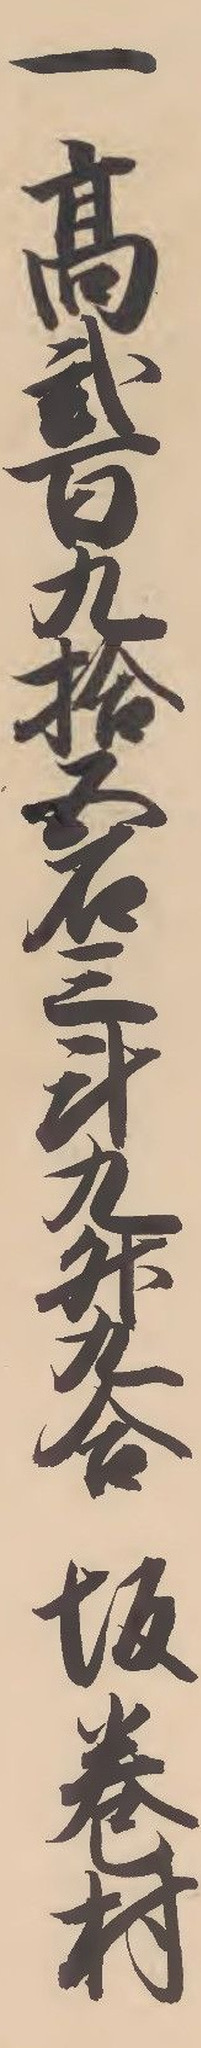一高弐百九拾五石三斗九升九合坂巻村
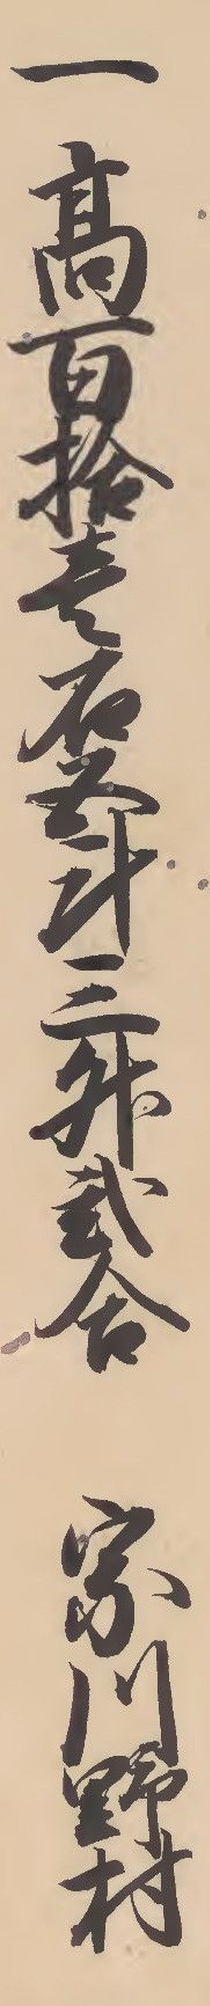一高百拾壱石五斗三升弐合宗川野村

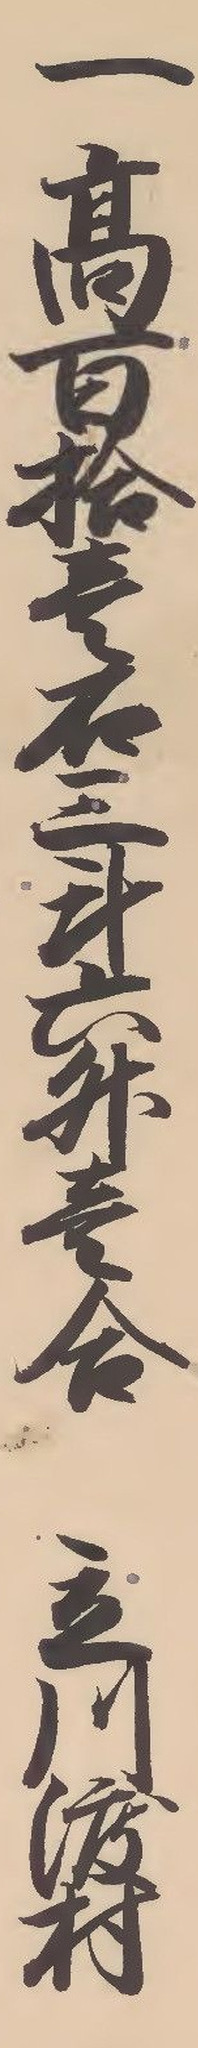一高百拾壱石三斗六升壱合立川渡村
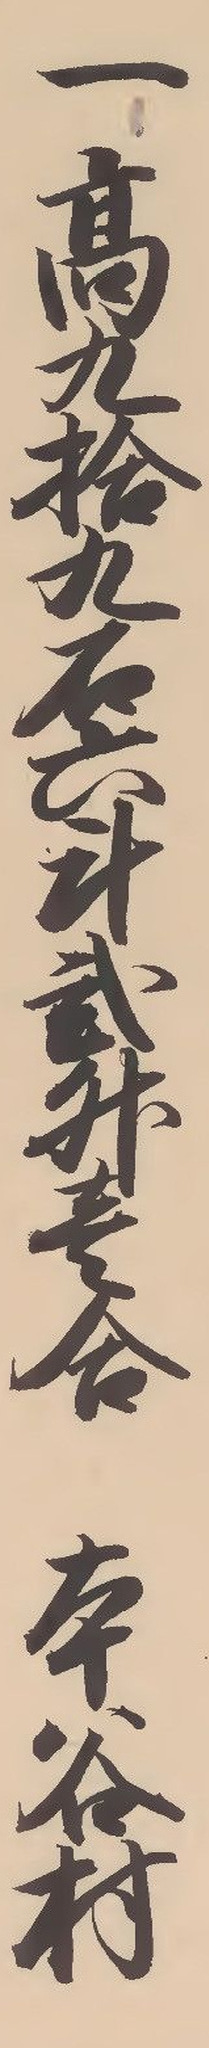一高九拾九石六斗武升壱合本谷村
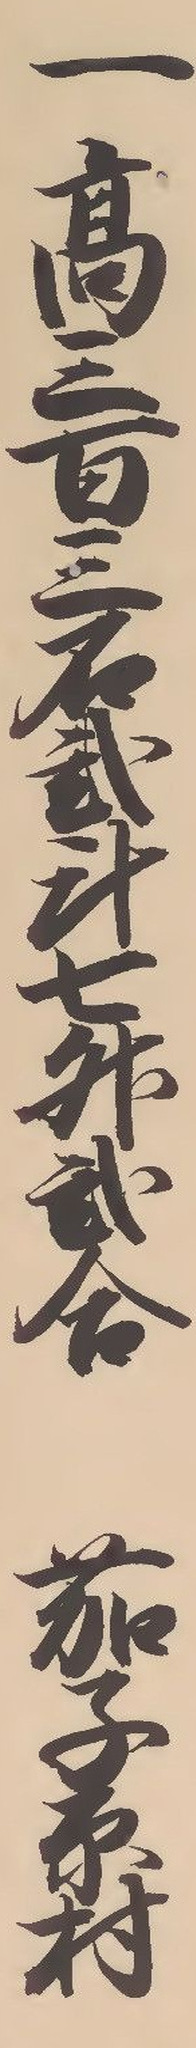一高三百三石弐斗七升弐合茄子原村
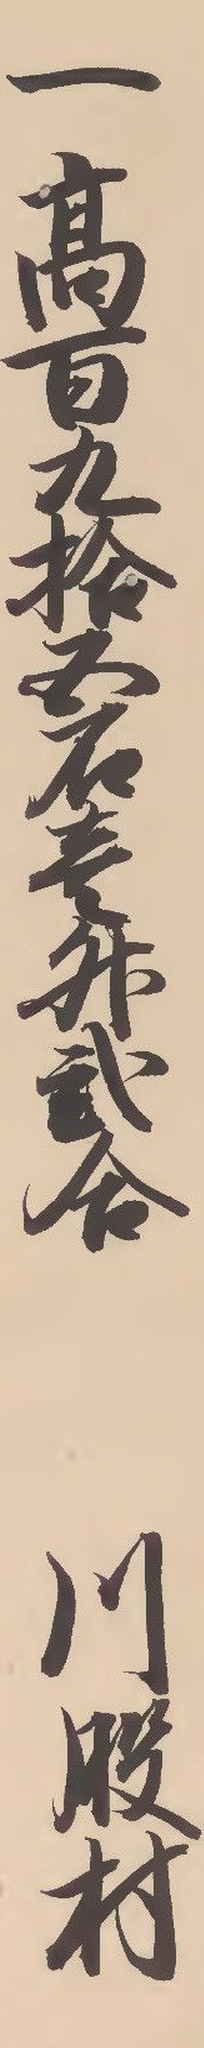一高百九拾五石壱升弐合川股村
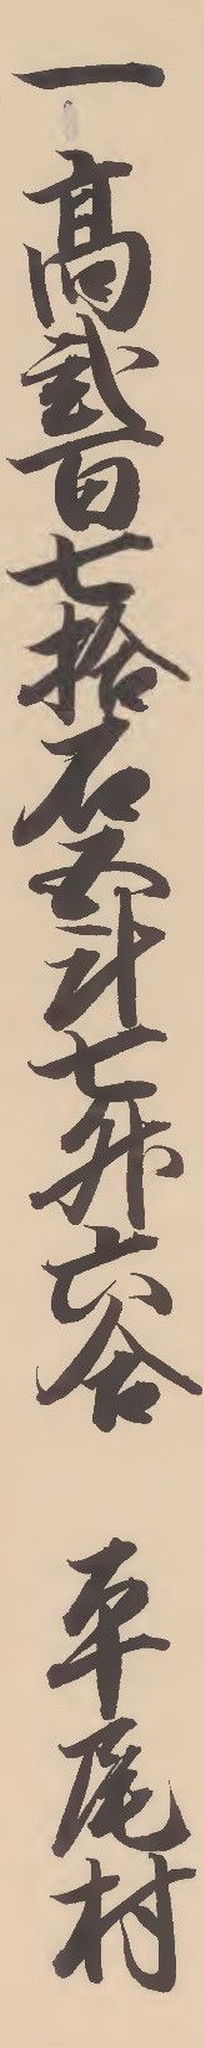一高弐百七拾石五斗七升六合平尾村
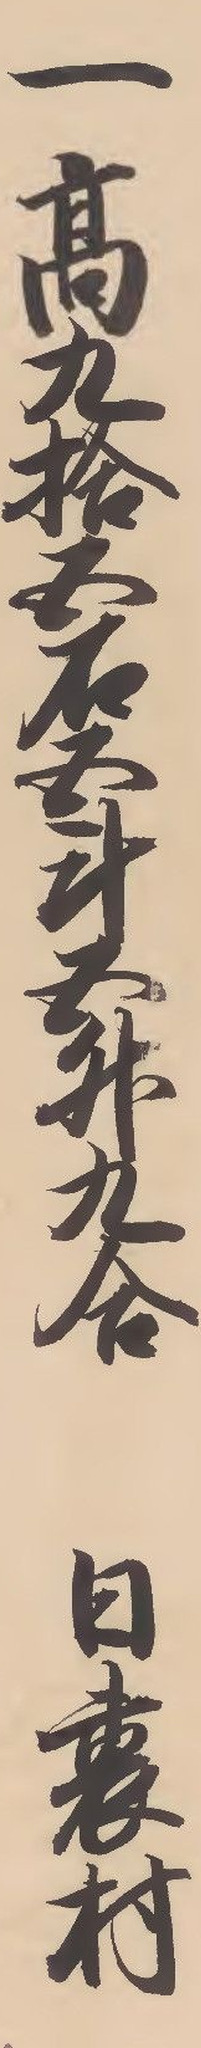一高九拾五石五斗五升九合日裏村

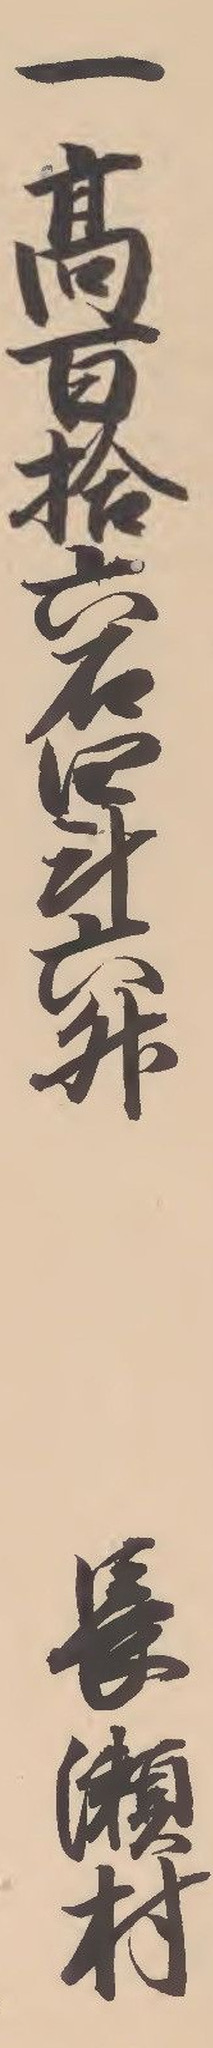一高百拾六石四斗六升長瀬村
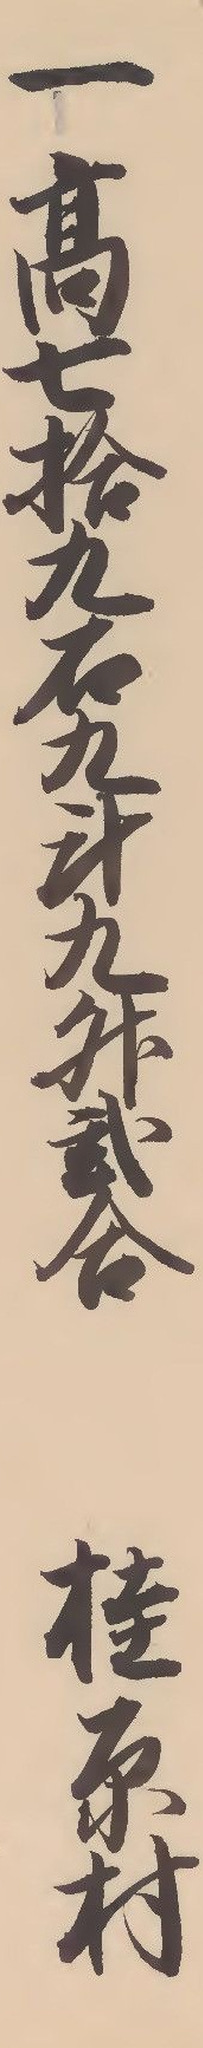一高七拾九石九斗九升弐合桂原村
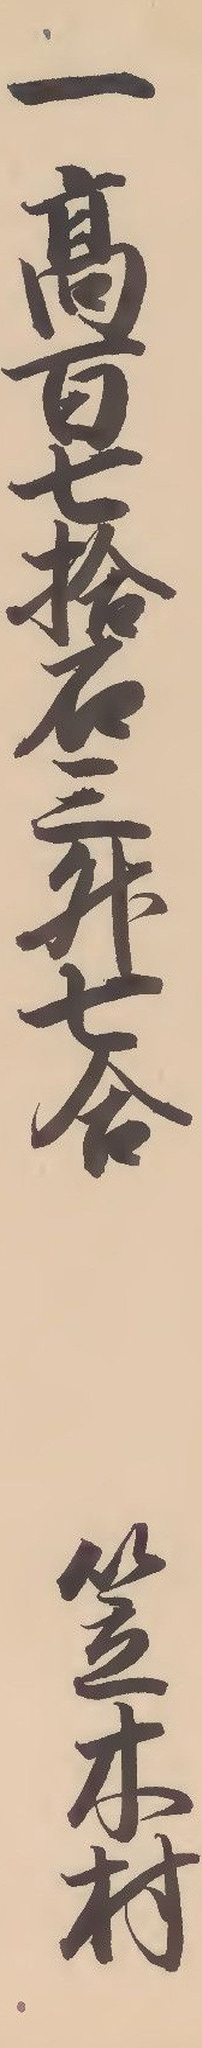一高百七拾石三升七合笠木村
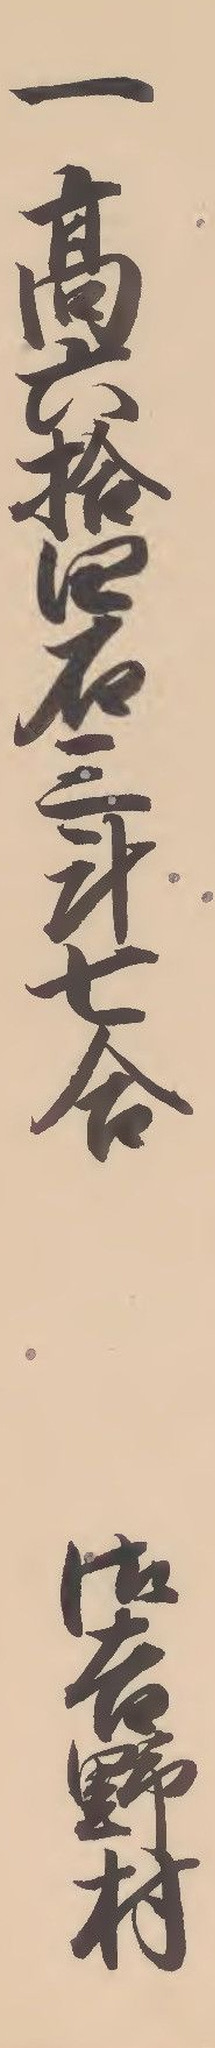一高六拾四石三斗七合御吉野村

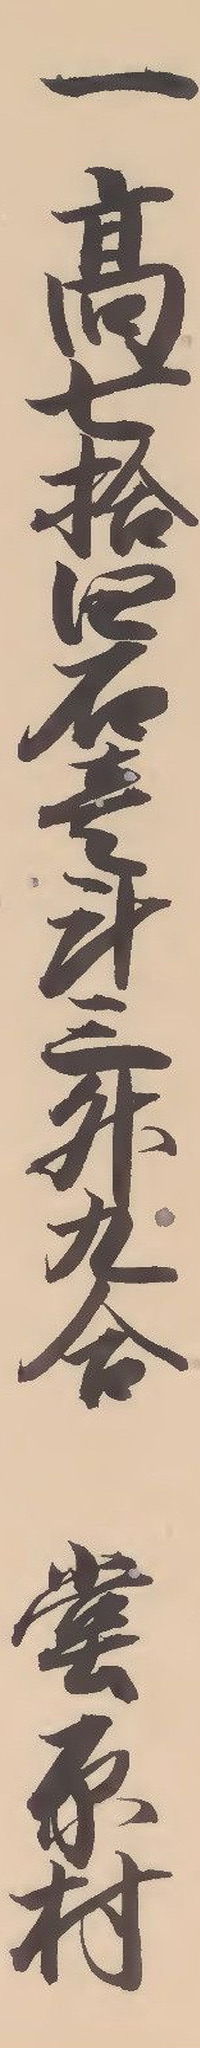一高七拾四石壱斗三升九合堂原村
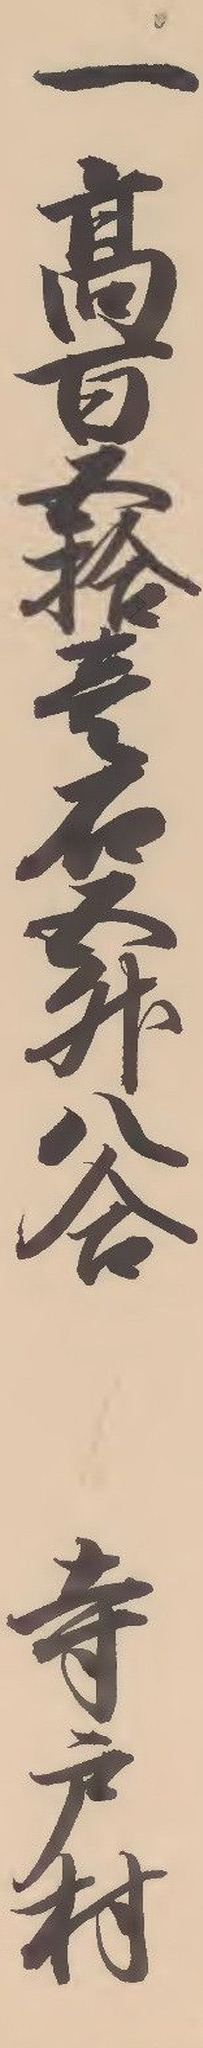一高百五拾壱石五升八合寺戸村
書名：大和国郷帳
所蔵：国立公文書館 National Archives of Japan
